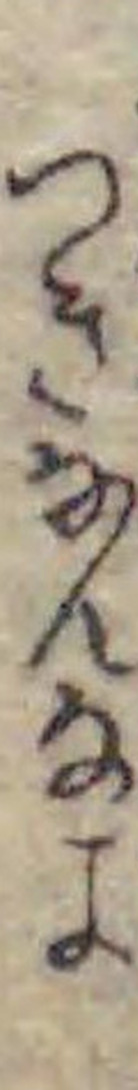つきなんなよ
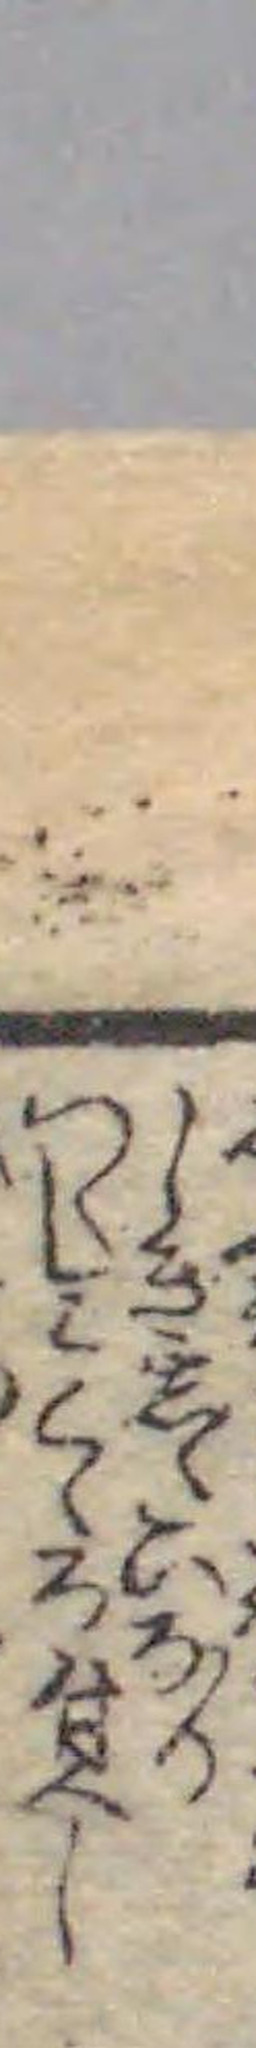つゝしみこゝろ付へし
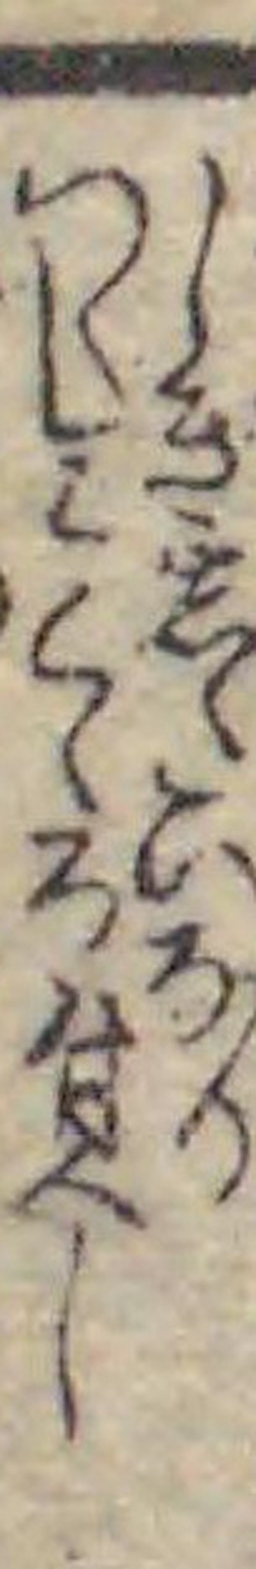つゝしみこゝろ付へし
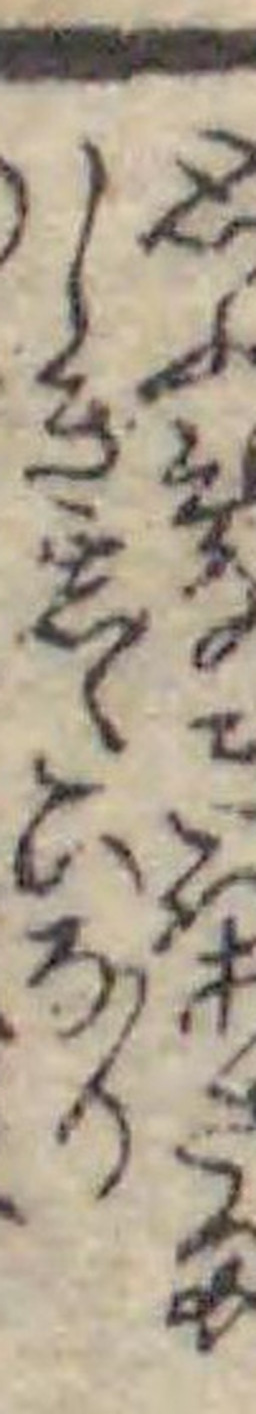しきしたいなり
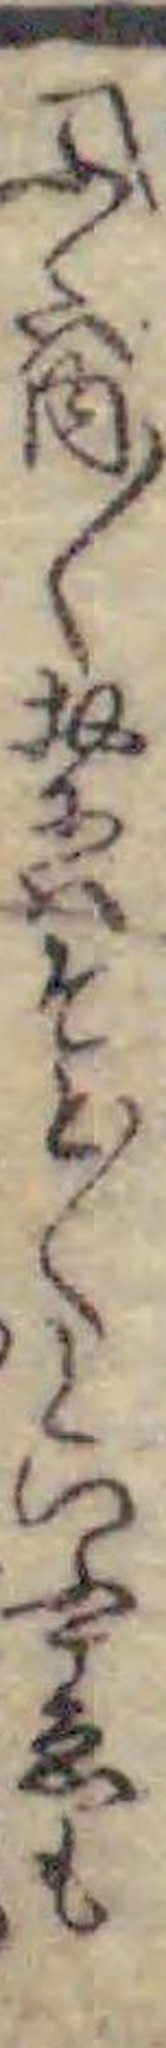〽ふくは内〳〵おにはそと〳〵といふこゑも
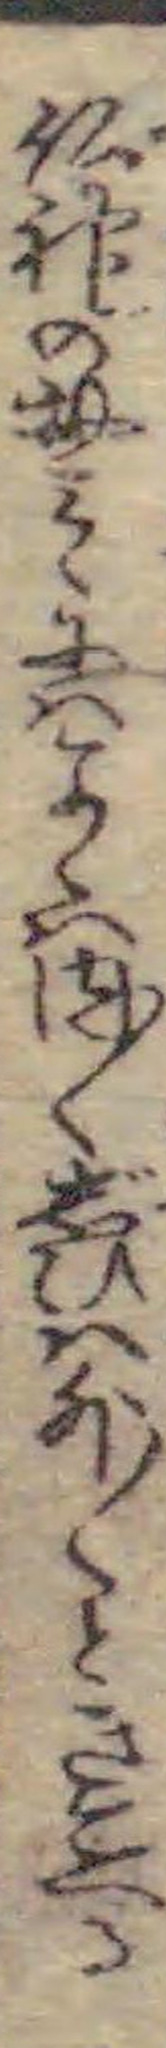仏神のおみゝにはよくは内〳〵じひは外〳〵ときこへる

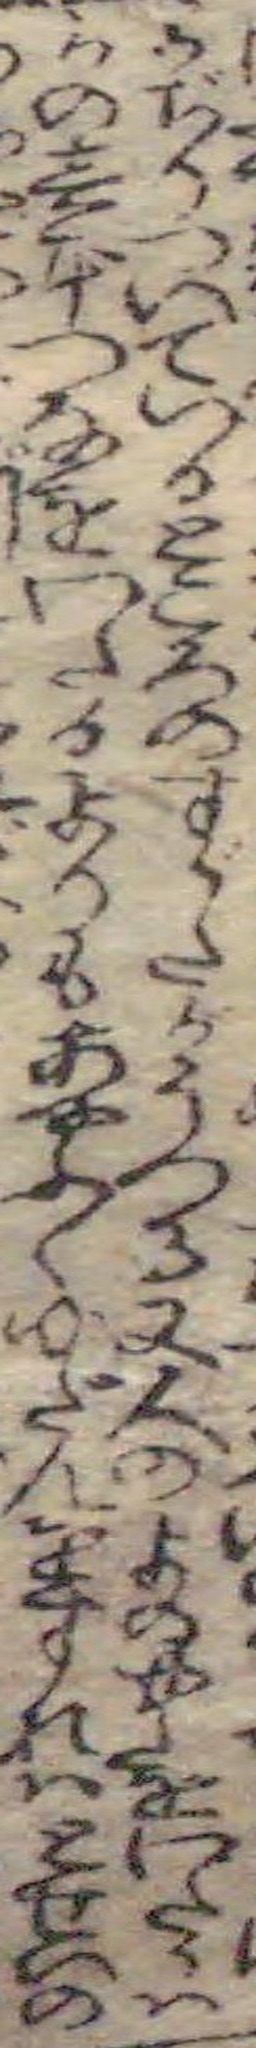かの壱本つなをわたるよりもあやふくゆだんをすれはとせいの
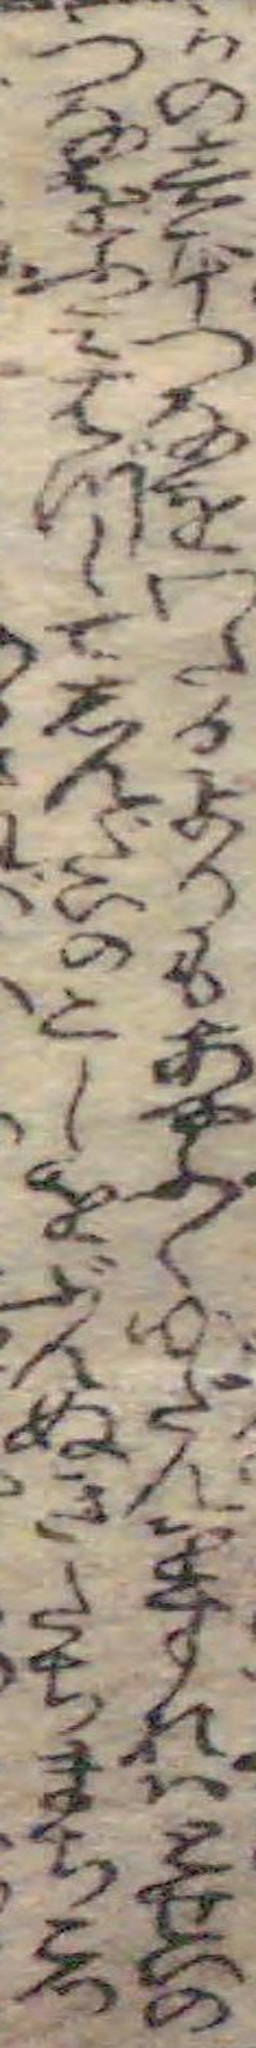つなをふみはづしてしんだいのこしをぶんぬきたちまちこつ
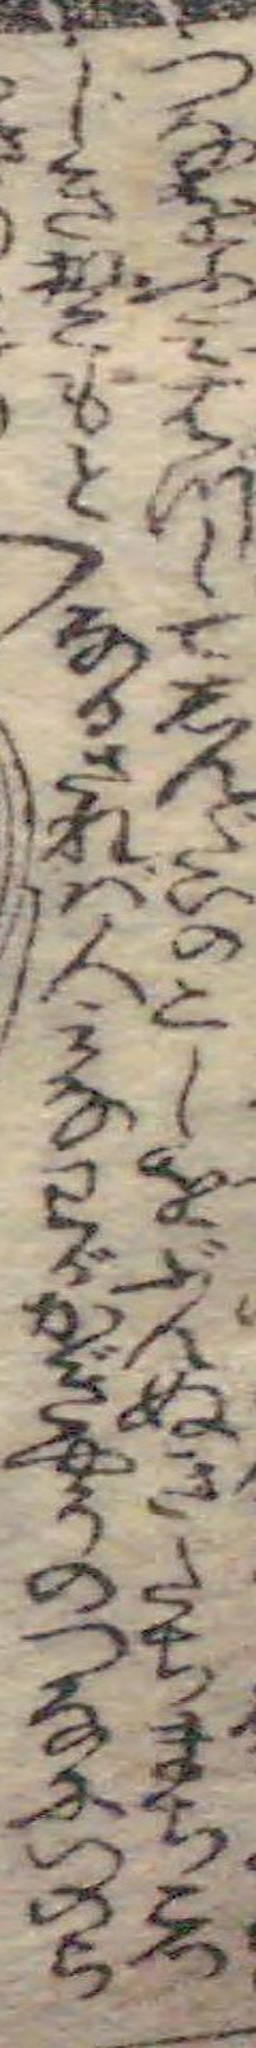じきおこもとなるされば人みなわがかぎやうのつなにいのち
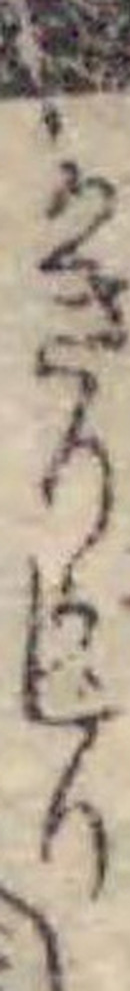かきりかじり
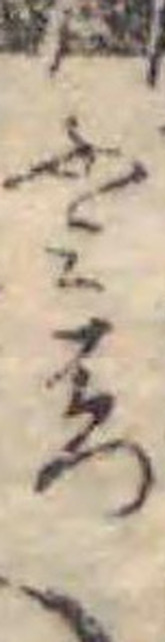ふみはつ
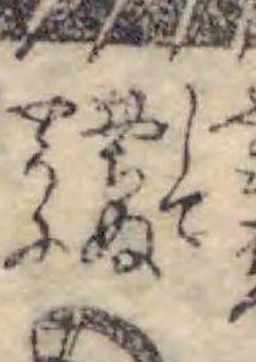やうに
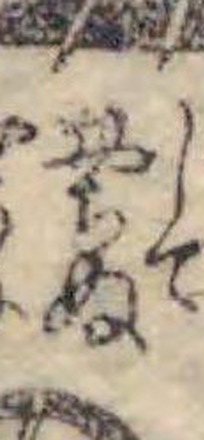おちぬ
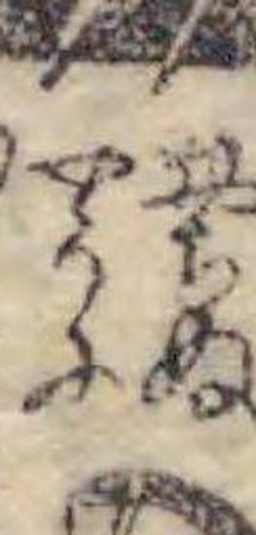やうに
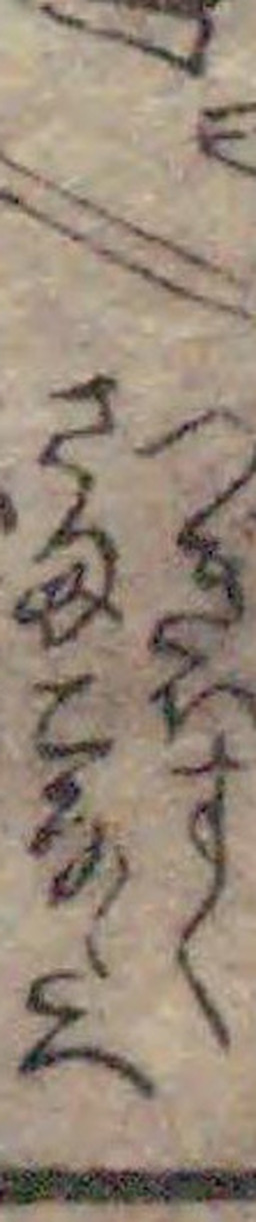さまこなたへ
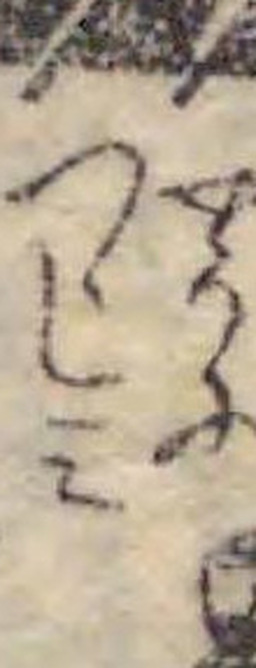つゝしみ
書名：人心鏡写絵 : 3巻
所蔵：国立国会図書館 National Diet Library, JAPAN
